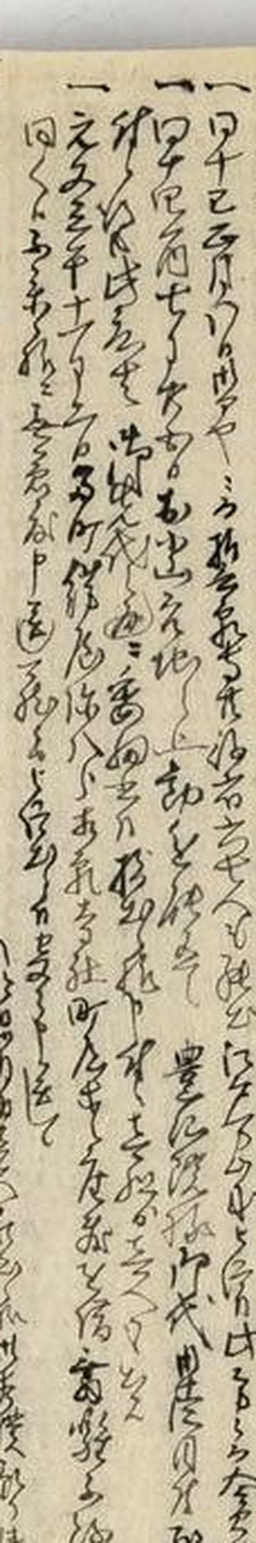付候得共此度は御先代之通に委細書付指出候様申付候壱組ゟ壱人ツヽ出ス
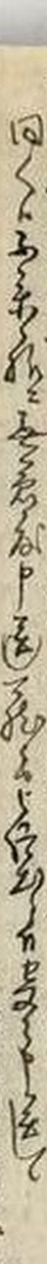同くは不参候様に無急度申達可然旨被仰出候に付寄々申達候
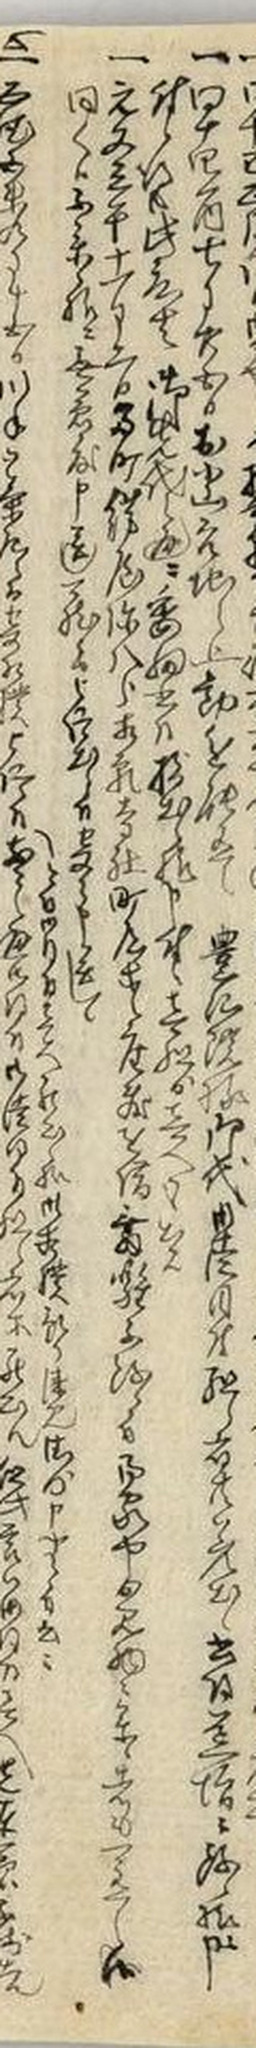一元文三午十一月二日当町餝屋弥八郎相願寺社町家等之屋敷を借舞囃子致候に付御家中ゟ見物に参候者も可有之候
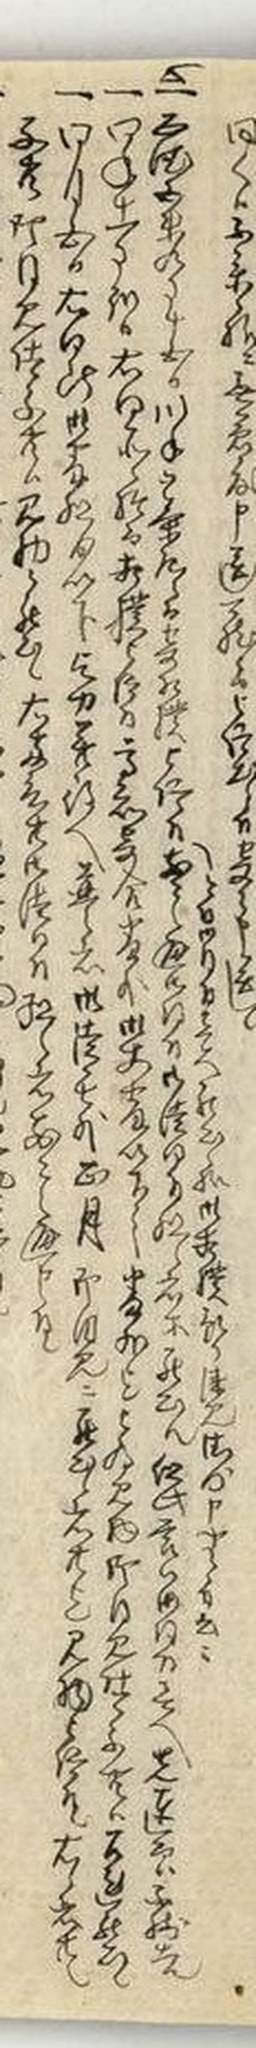一同年十一月朔日右同所に於て相撲被仰付高知寄合番外御使番以下之番外迄被為見物御目見仕候子共は召連罷出候
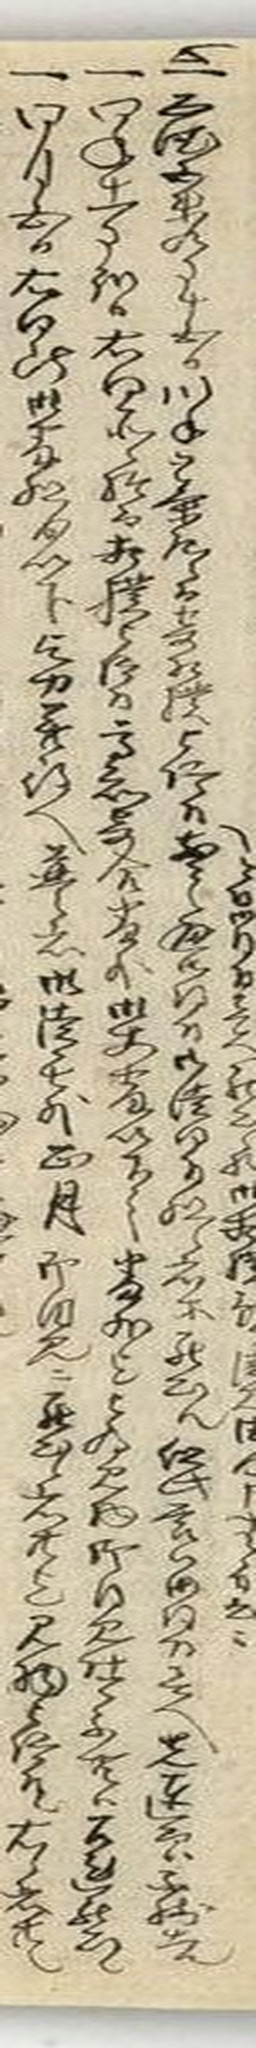一同月五日右同断御番組ゟ以下与力并役人並之者御徒其外正月御目見に罷出候者共迄見物被仰付候右之者共之
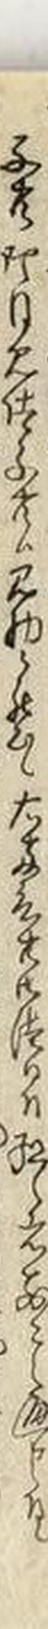子共御目見仕候子共は見物に罷出候右両度共御徒目付組之者前々之通申付候
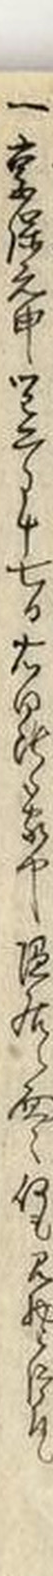一享保元申閏二月十七日右同断御家中隠居之面々何も見物被仰付候
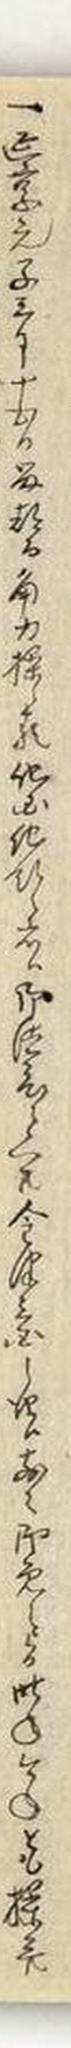一延享元子三月十五日留都て角力操之類他国他領之者は御法度に候へ共金津三国之儀は前々御免之旨昨年今年とも操并
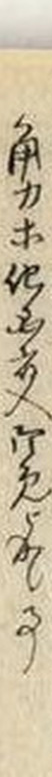角力等他国者入御免被成候事

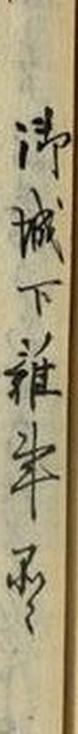御城下雑事品々
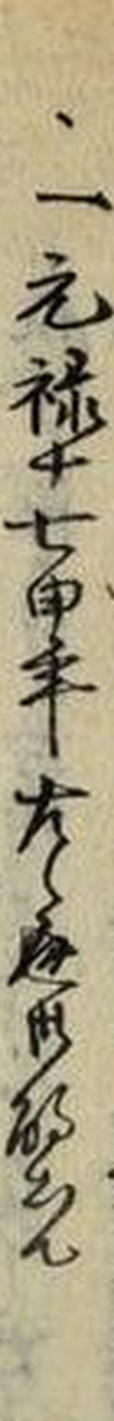一元禄十七申年左之通御触出ル
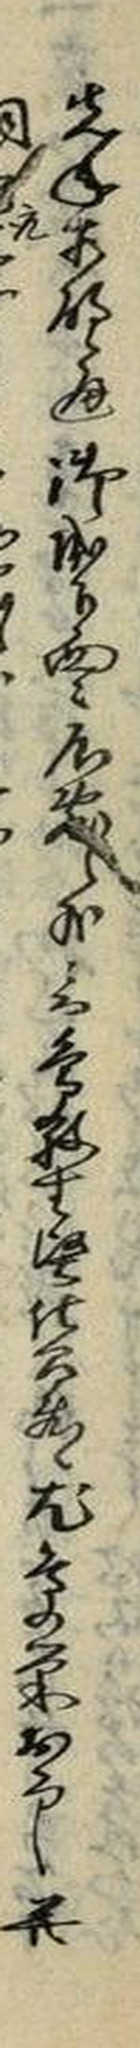先年相触候通御城下面々屋敷之外にて鳥殺生堅仕間敷候尤鳥の巣おろし并
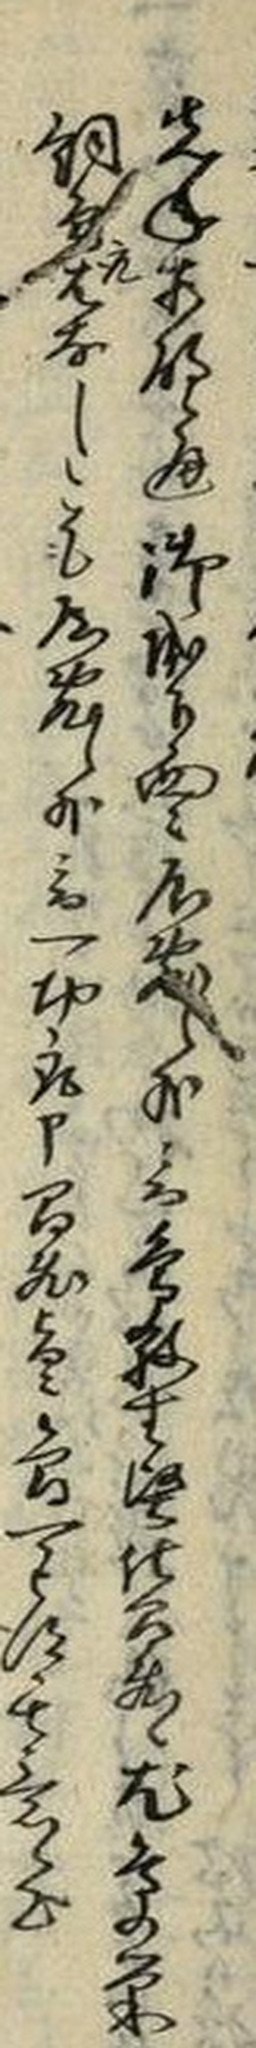飼鳥取はなし候とも屋敷之外にて一切取申間敷旨に候間可被得其意候以上
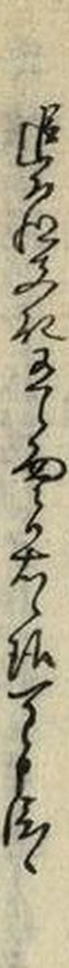追て組支配有之面々は右之趣可被申渡候
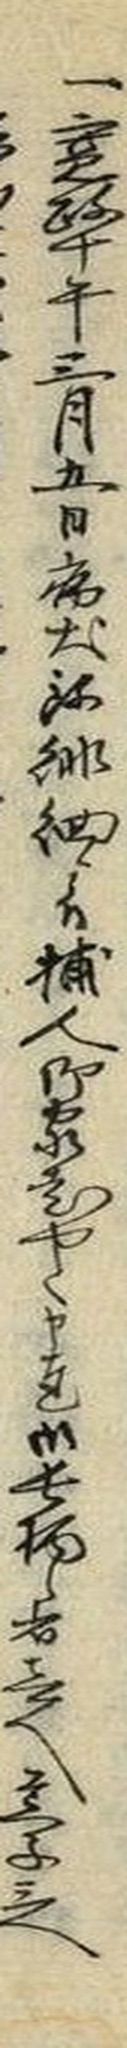一寛政十午三月五日病犬致徘徊候に付捕人御家老中へ申達御長柄之者壱人荒子三人
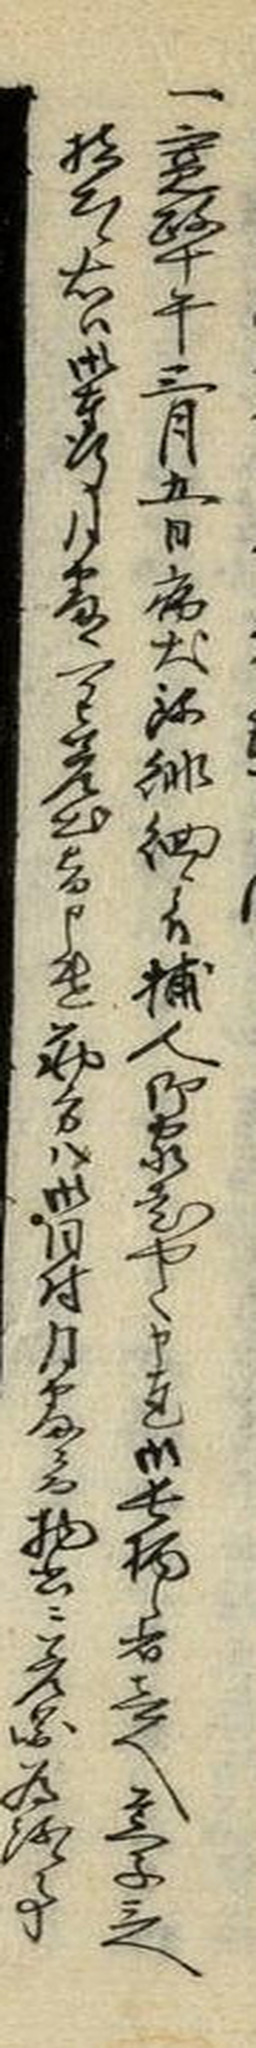指出候右は御奉行月番へ可被差出旨申遣勤方は御目付月番にて物書に差図為致候事
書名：御城下諸事之部
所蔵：福井県文書館 Fukui Prefectural Archives
